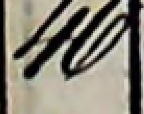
46
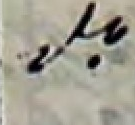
Do
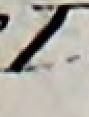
I
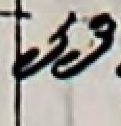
53
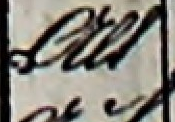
Alt
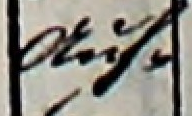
Aus„
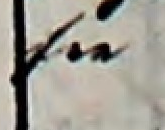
see
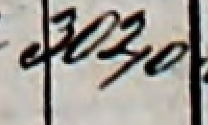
302,0
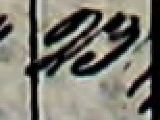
23
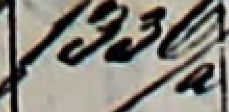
1336/a
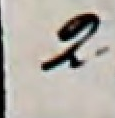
2
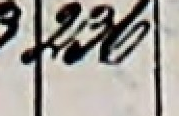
236
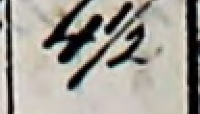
4 1/2
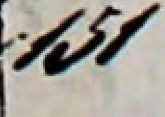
151
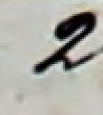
2
